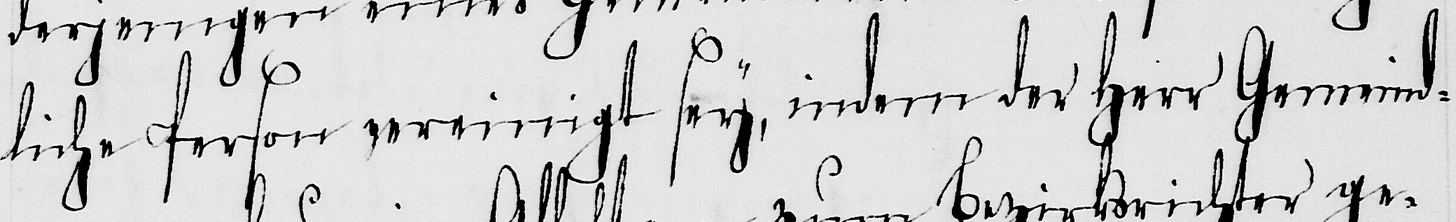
liche Person vereinigt sey, indem der Herr Gemeind¬
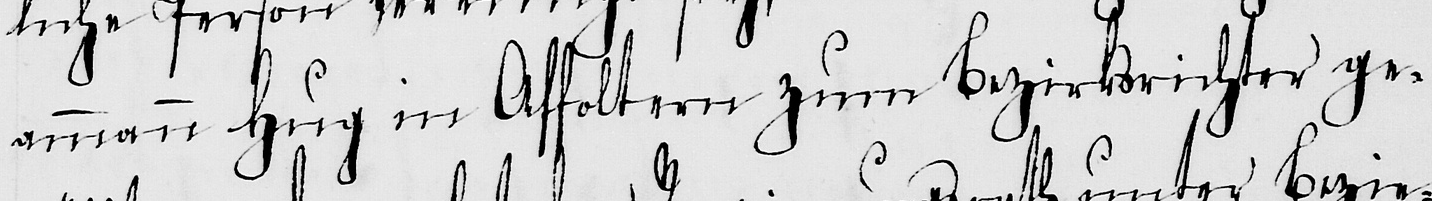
ammann Hug in Affoltern zum Bezirksrichter ge¬
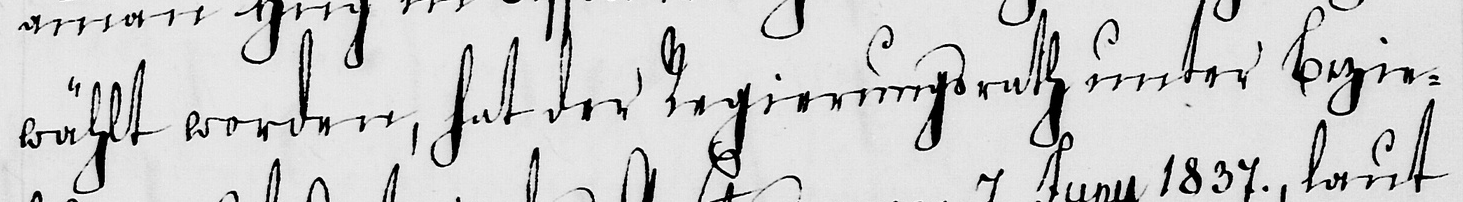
wählt worden, hat der Regierungsrath unter Bezie¬
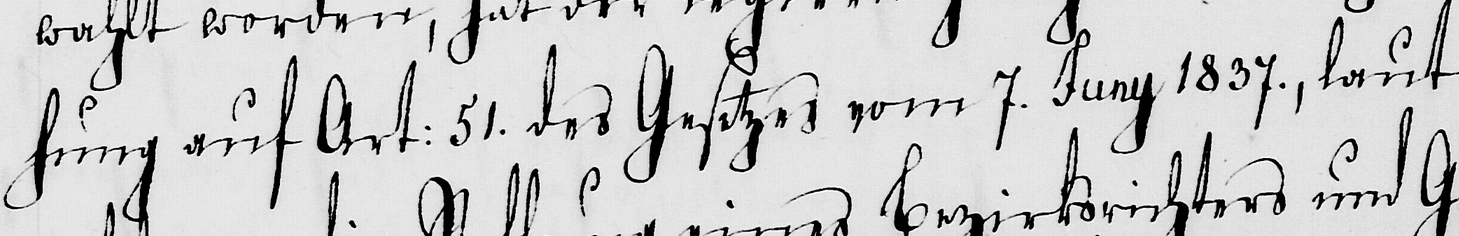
hung auf Art: 51 des Gesetzes vom 7. Juny 1837., laut
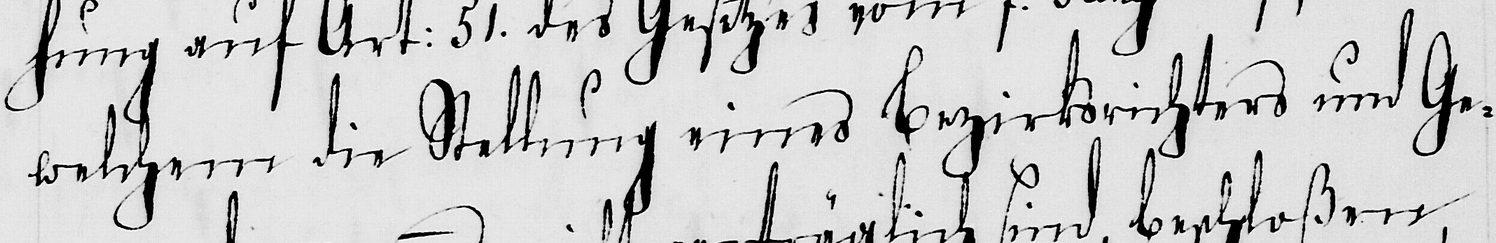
welchem die Stellung eines Bezirksrichters und Ge¬
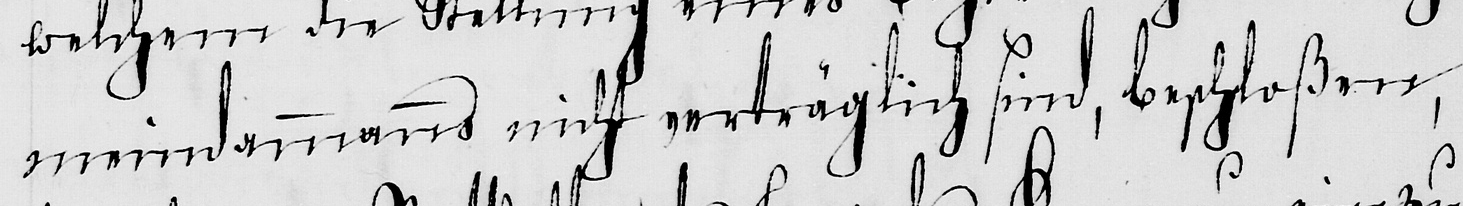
meindammanns nicht verträglich sind, beschloßen,
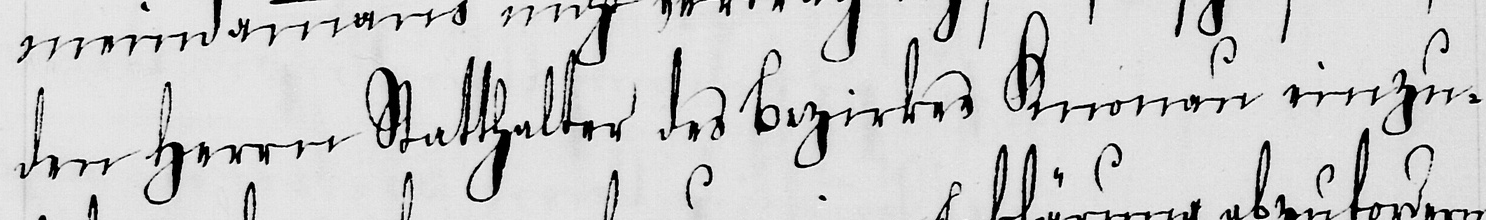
den Herrn Statthalter des Bezirkes Knonau einzu¬
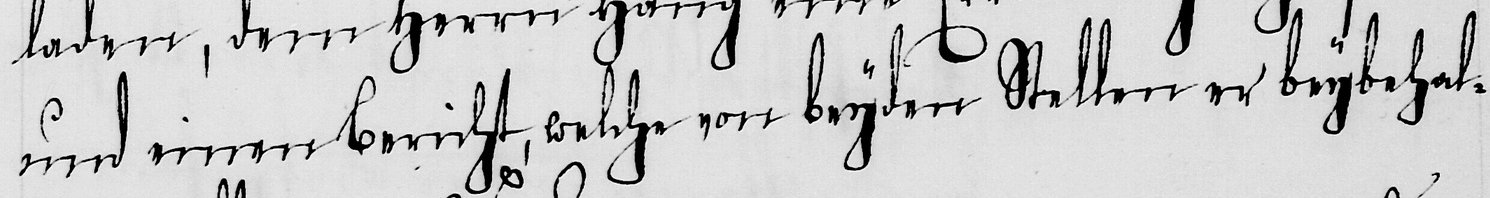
und einen Bericht, welche von beyden Stellen er beybehal¬
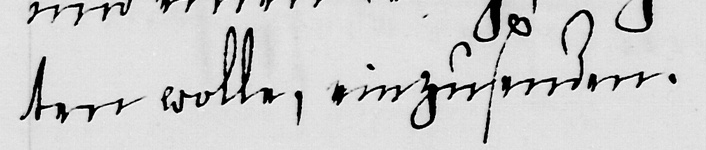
ten wolle, einzusenden.
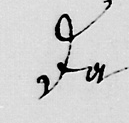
der
